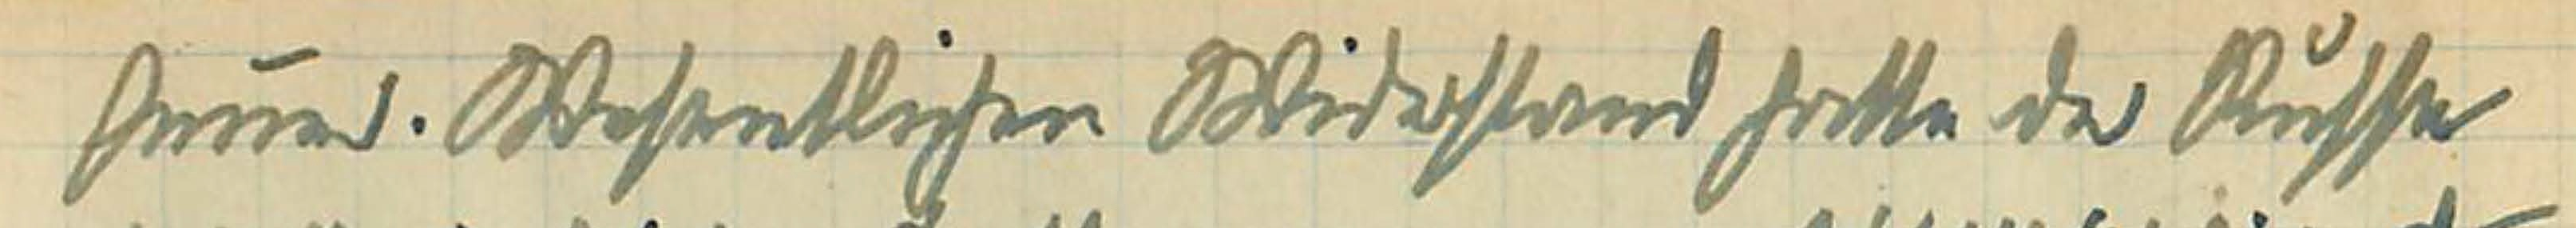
feuer. Wesentlichen Widerstand hatte der Russe
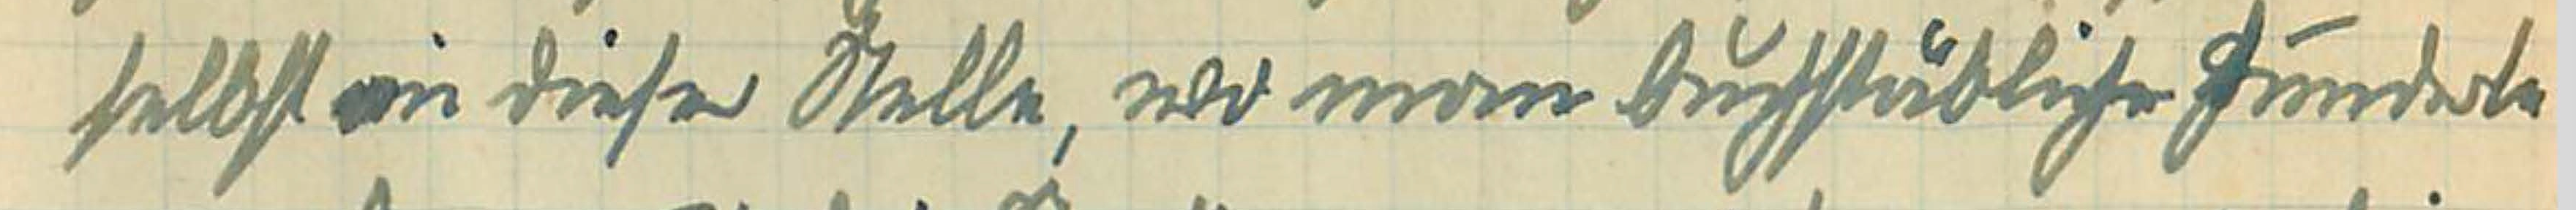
selbst an dieser Stelle, wo man buchstäbliche hunderte
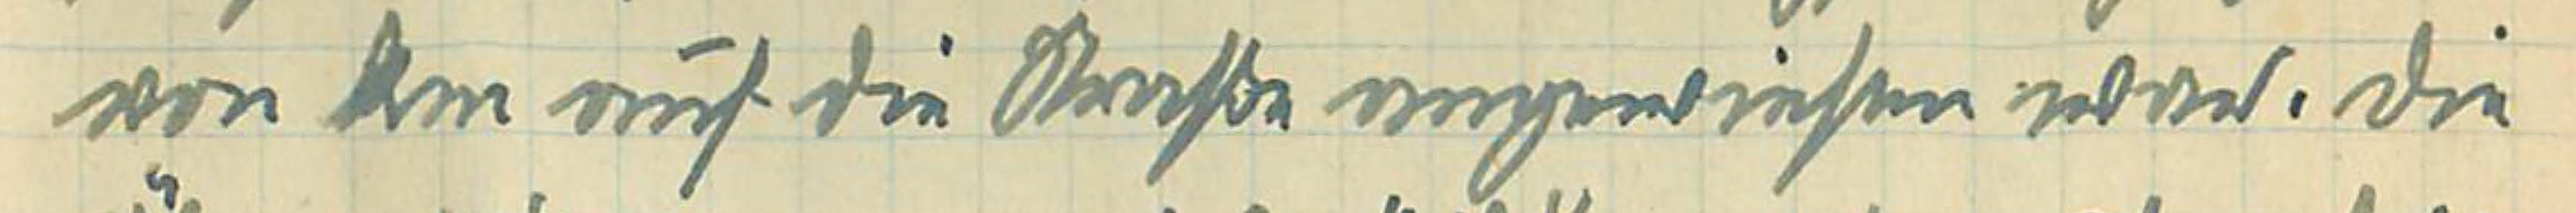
von km auf die Straße angewiesen war. Die
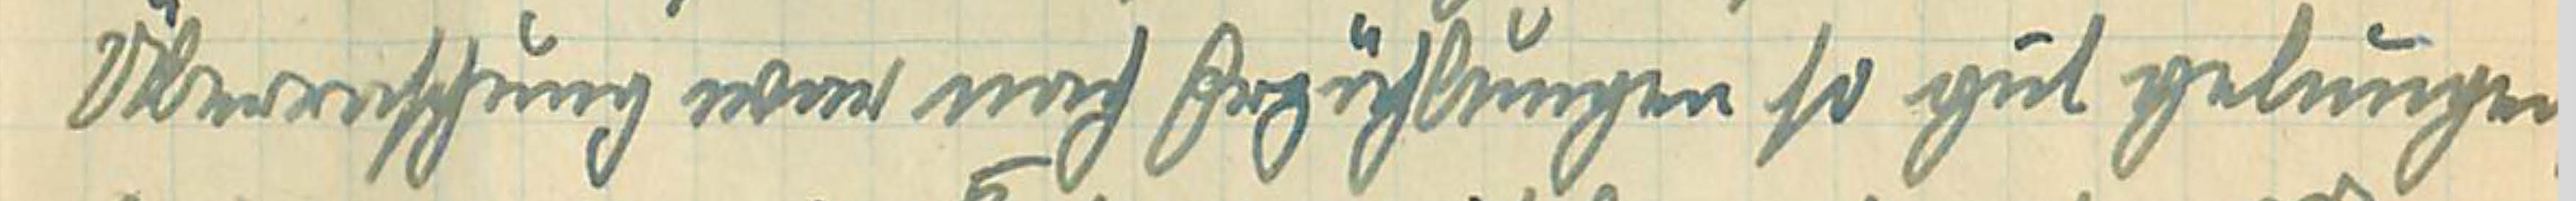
Überraschung war nach Erzählungen so gut gelungen,
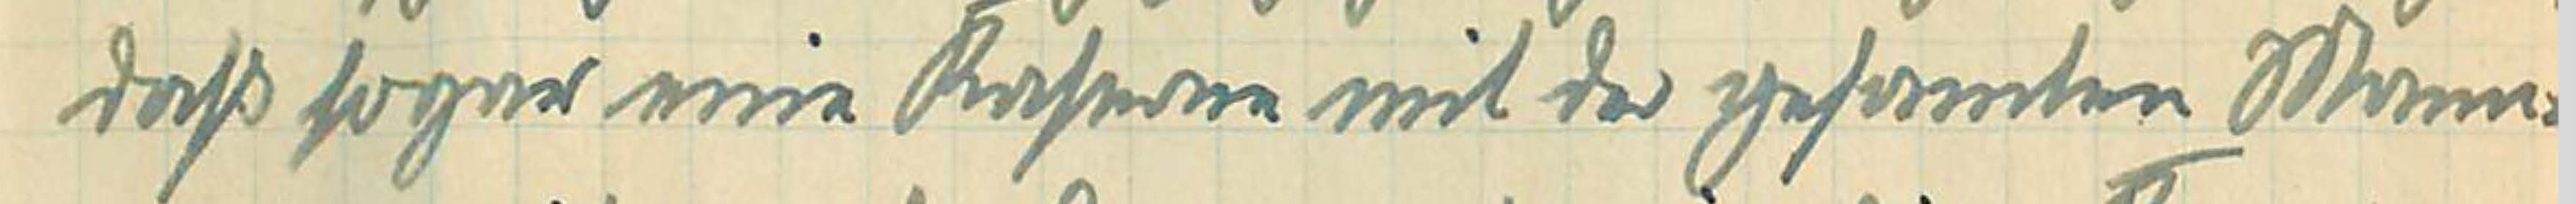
daß sogar eine Kaserne mit der gesamten Mann-
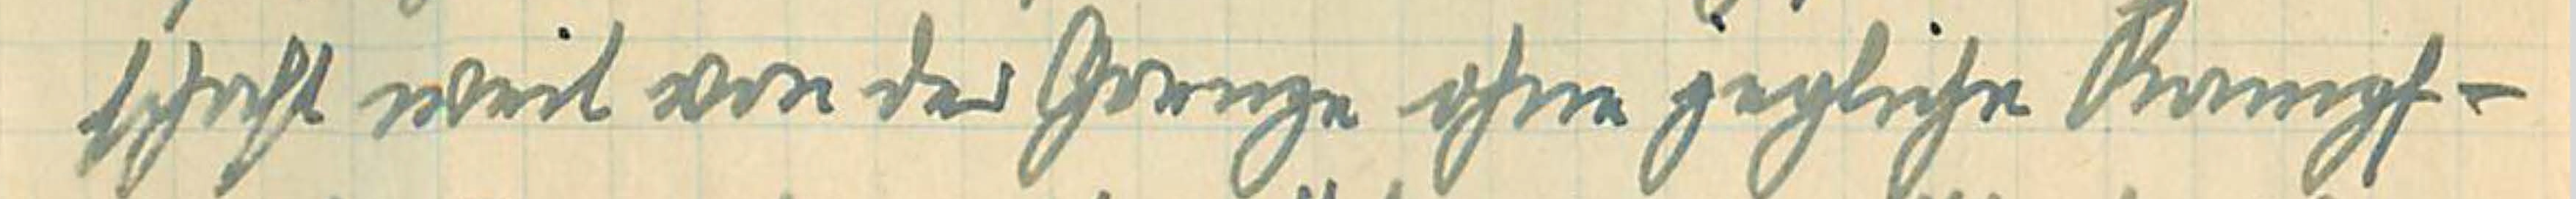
schaft weit von der Grenze ohne jegliche Kampf-
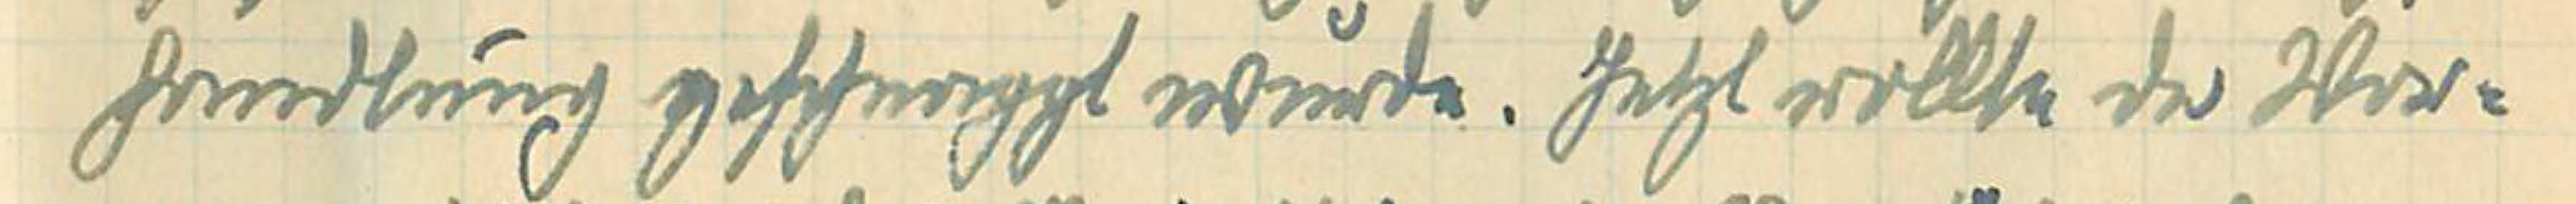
handlung geschnappt wurde. Jetzt rollte der Vor-
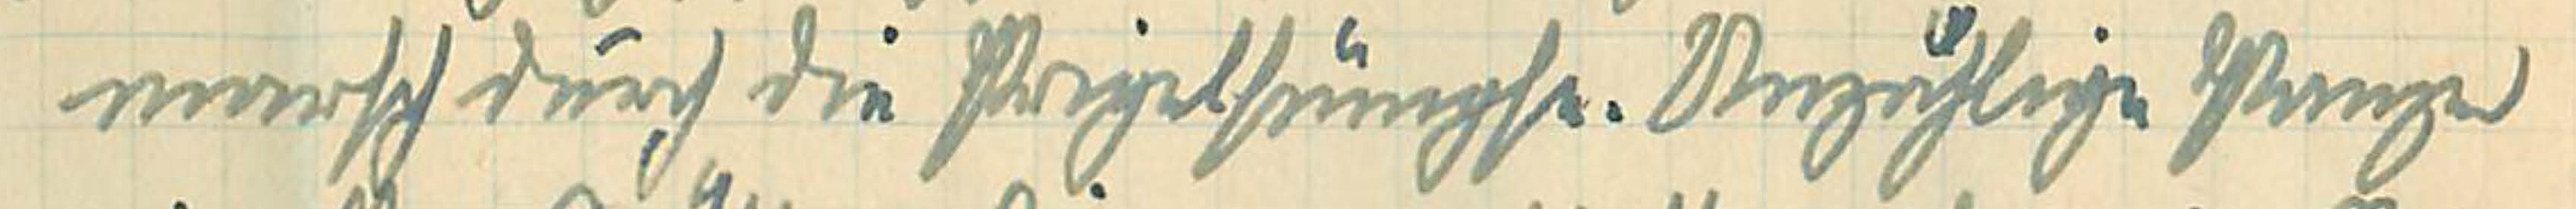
marsch durch die Pripetsümpfe. Unzählige Panzer
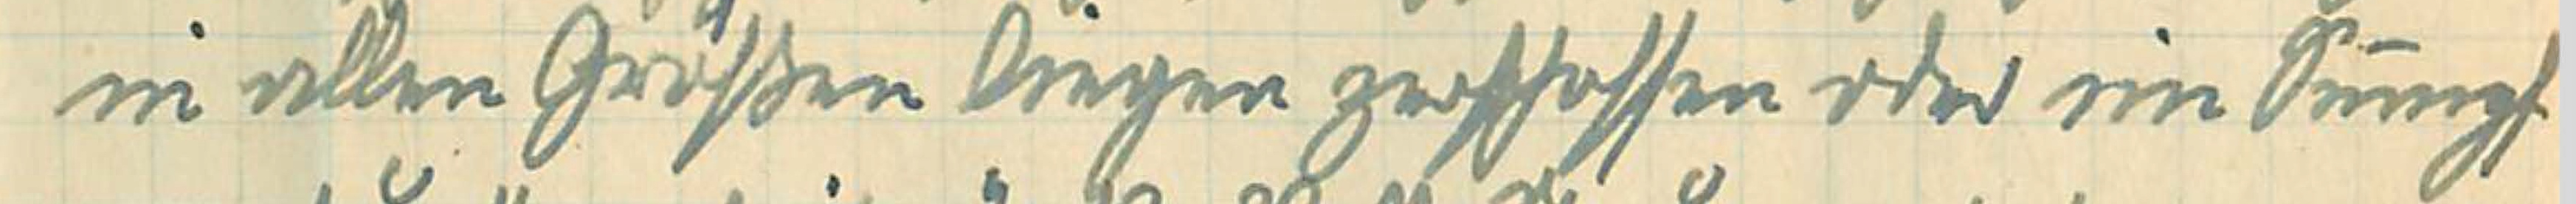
in allen Größen liegen zerschossen oder im Sumpf
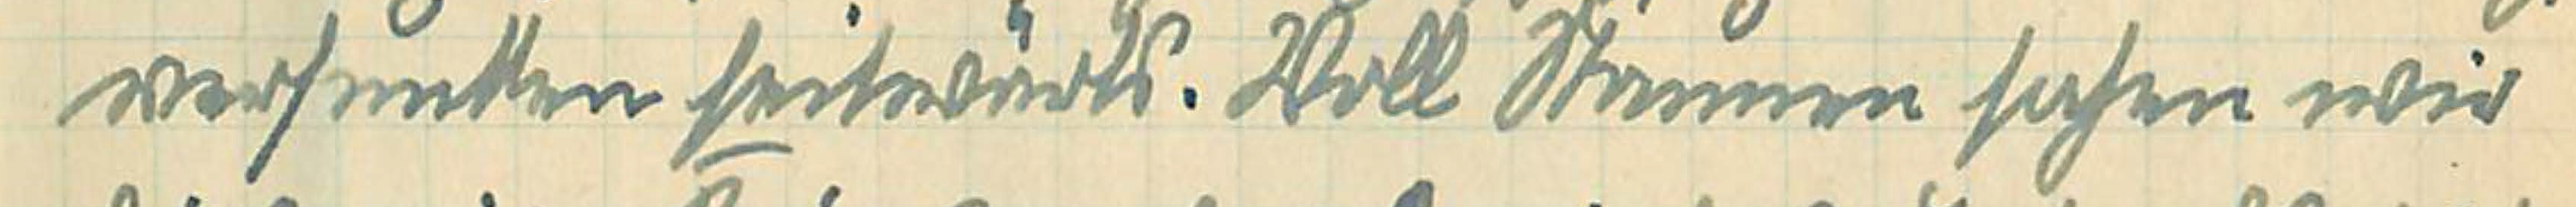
versunken seitwärts. Voll Staunen sahen wir
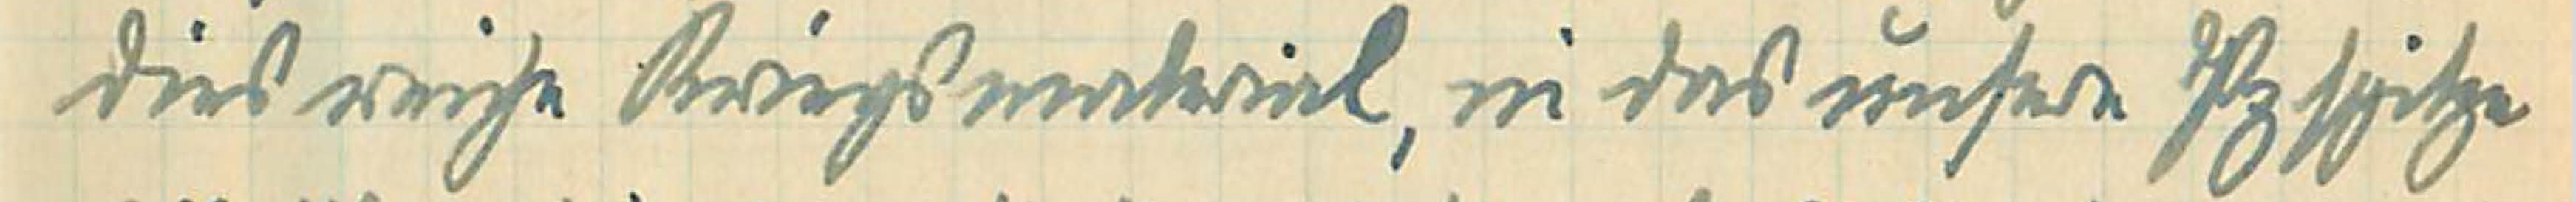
dies reiche Kriegsmaterial, in das unsere Pzspitze
